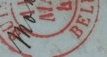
neben dieser
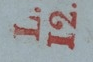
etwas
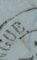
andres
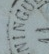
werde
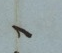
gar
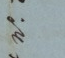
zu
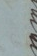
von
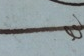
nun die herzlichsten
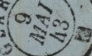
meiner Braut
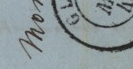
von den
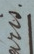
der
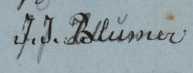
dir Berichte zu
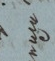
dich
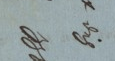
dein treuer
